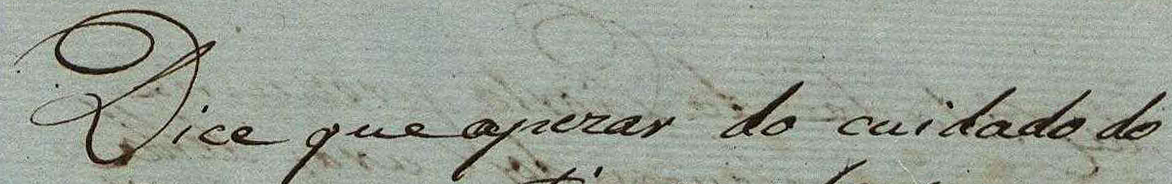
Dice que apezar do cuidado do
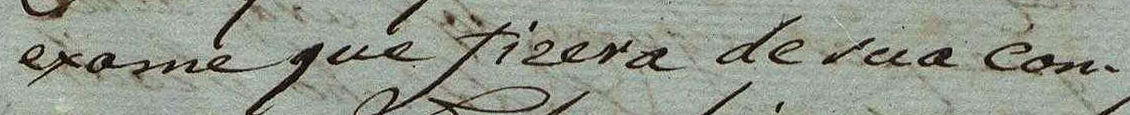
exame que fizera de sua con
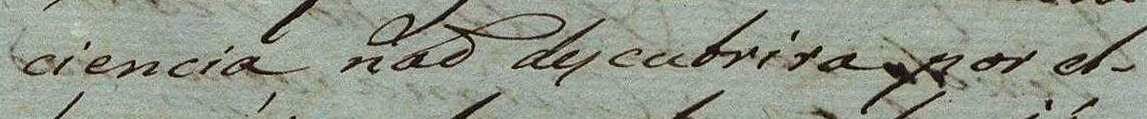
ciencia naõ descubrira por el
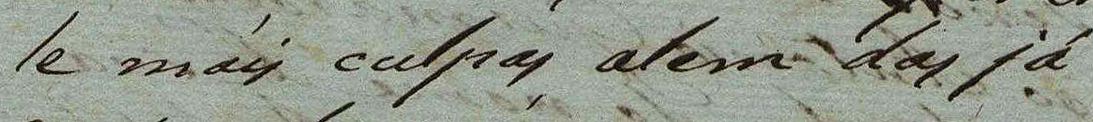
le mais culpas, alem das já
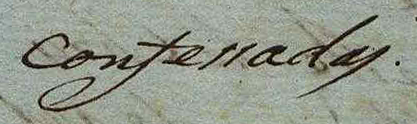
confessadas.
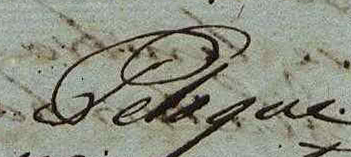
Pelo que
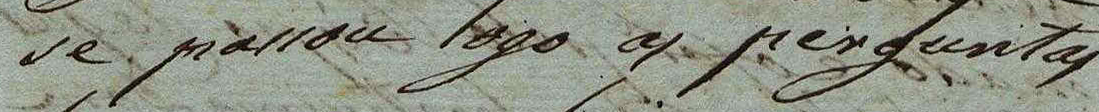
se passou logo as perguntas
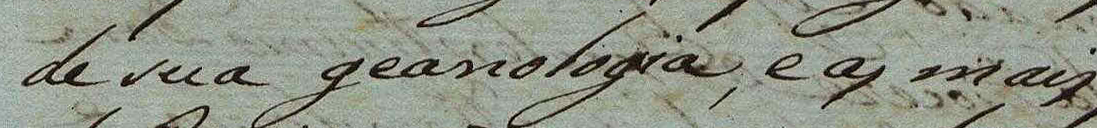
de sua geanologia, e as mais
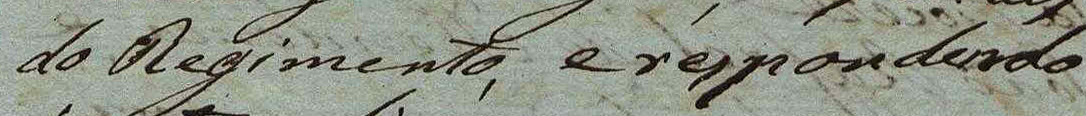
do Regimento, e respondendo
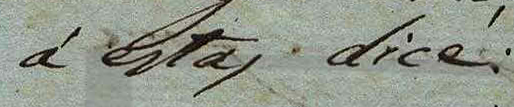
á estas dice:
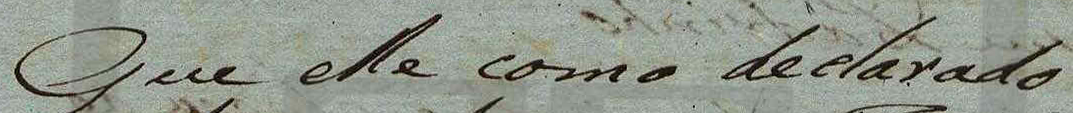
Que elle como declarado
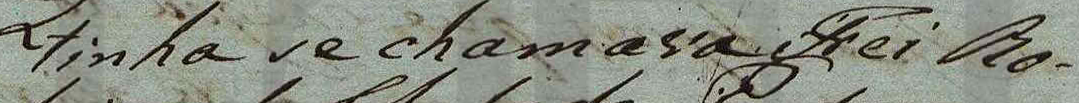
tinha se chamava Frei Ro
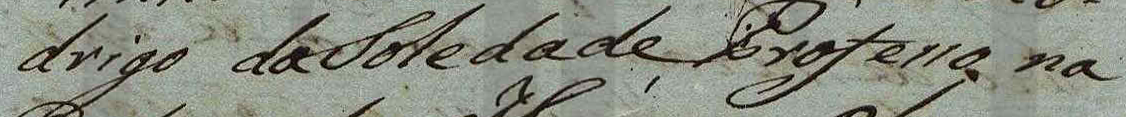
drigo da Soledade, Professo na
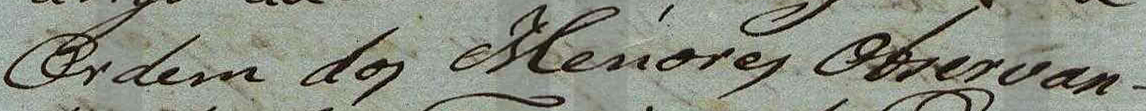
Ordem dos Menores Observan
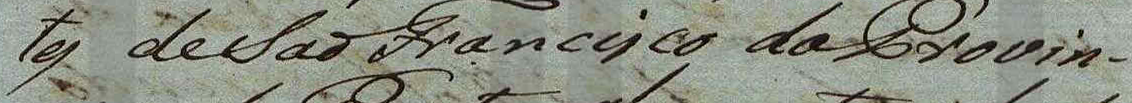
tes de Saõ Francisco da Provin
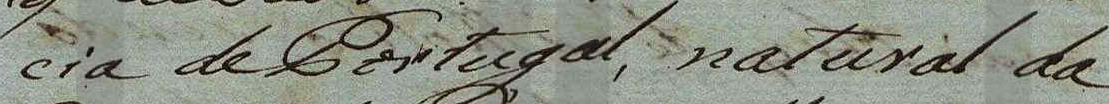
cia de Portugal, natural da
